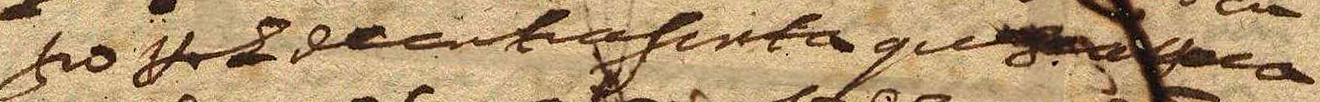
tro Rol de outra finta que se aReca
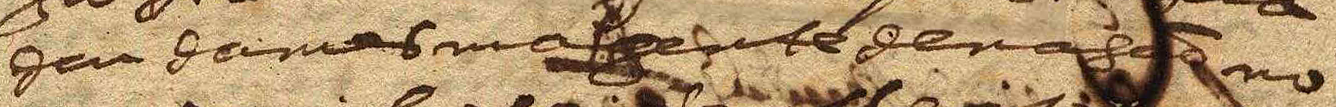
dou da mesma gente de nasaõ no
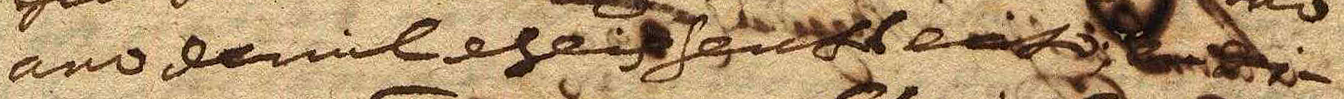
ano de mil e seissentos e oito em di
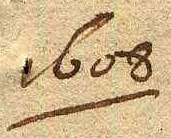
1608
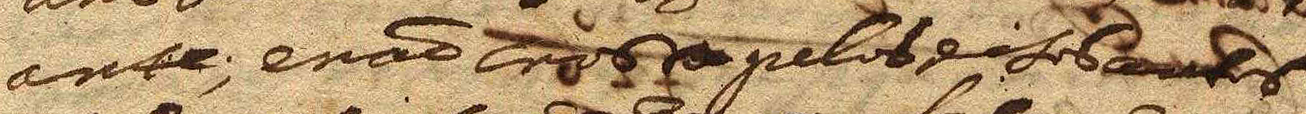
ante; e naõ consta pelos ditos autos
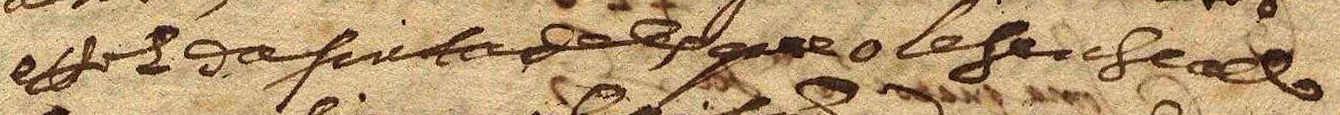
o Rol da finta deles que o lesenseado
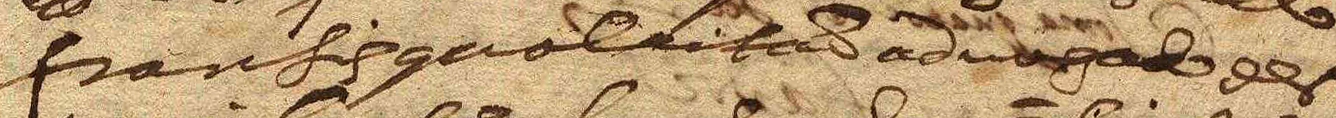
fransisquo leitaõ aduogado des
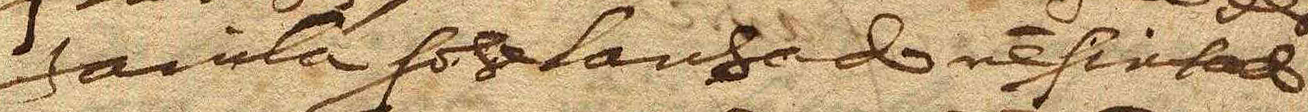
ta uila fose lansado nē fintado
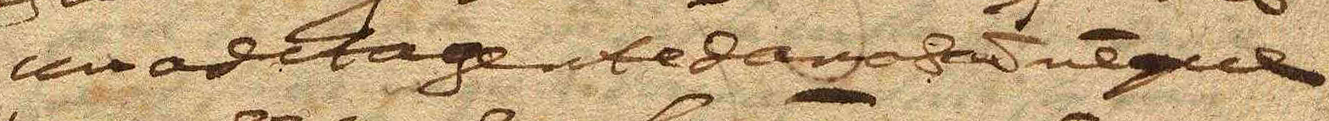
com a dita gente da nasaõ nē que
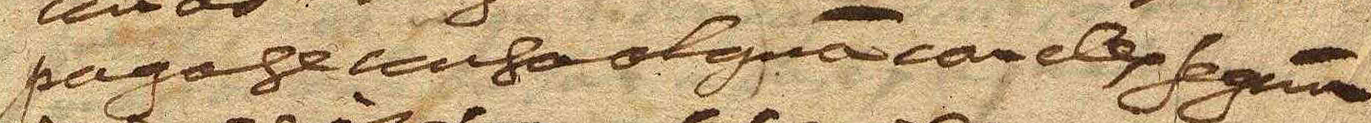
pagase cousa alguā con eles segun
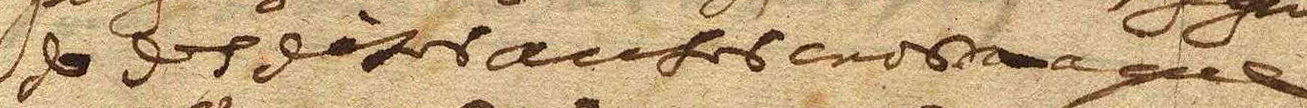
do dos ditos autos consta a que
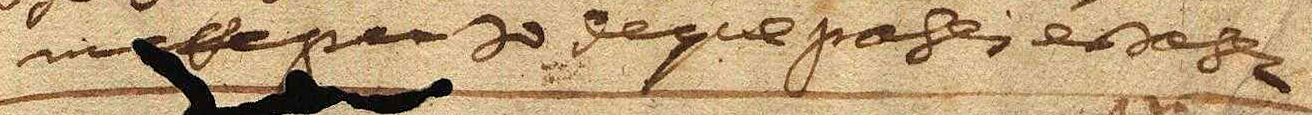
me Reporto de que pasei esta ser
